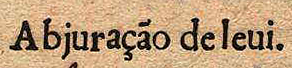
Abjuração de leui.
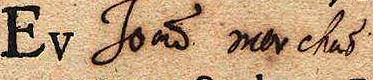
EV Joaõ marchaõ
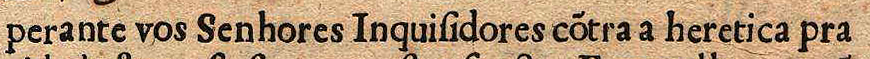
perante vos Senhores Inquisidores cōtra a heretica pra
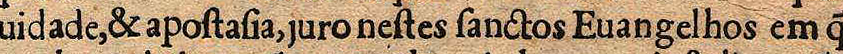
uidade, & apostasia, juro nestes sanctos Euangelhos em q̄
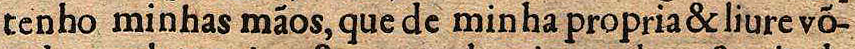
tenho minhas mãos, que de minha propria, & liure vō
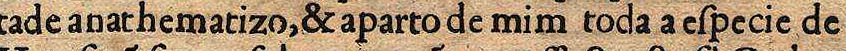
tade anathematizo, & aparto de mim toda a especie de
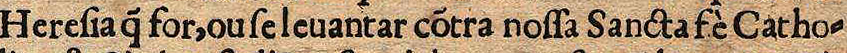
Heresia q̄ for, ou se leuantar cōtra nossa Sancta fè Catho
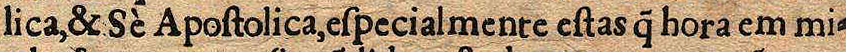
lica, & Sè Apostolica, especialmente estas q̄ hora em mi
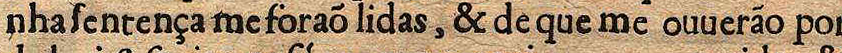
nha sentença me foraõ lidas, & de que me ouuerão por
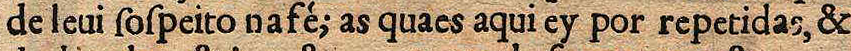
de leui sospeito na fé; as quaes aqui ey por repetidas, &
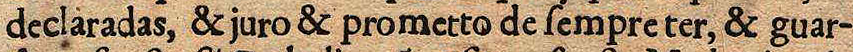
declaradas, & juro & prometto de sempre ter, & guar
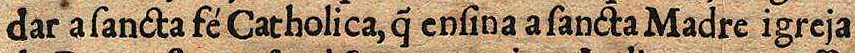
dar a sancta fé Catholica, q̄ ensina a sancta Madre igreja
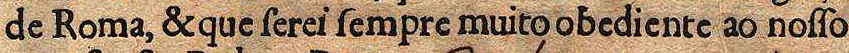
de Roma, & que serei sempre muito obediente ao nosso
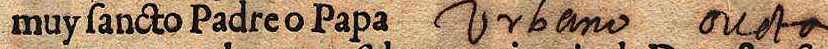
muy sancto Padre o Papa Vrbano oucta
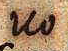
uo
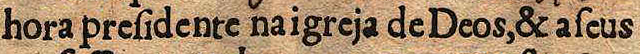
hora presidente na igreja de Deos, & a seus
